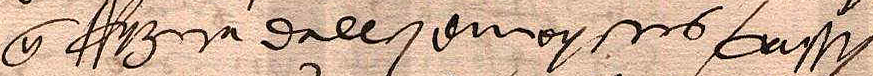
q̄ ffyzera da llej de moysees / e assy
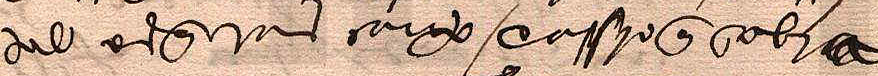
todo o ē q̄ era ē cargo / e assy o q̄ sabja
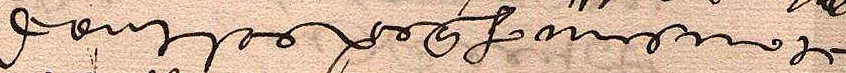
de outras pas q̄ ho mesmo te
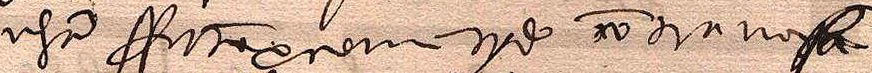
nhā ffeito e cometydo c̄otra nossa
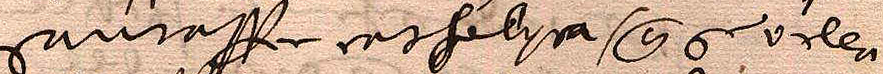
santa ffe catholyca / q̄ se o ella
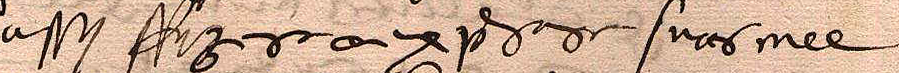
assy ffyzese e exp̄sase suas cull
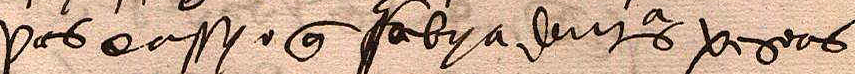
pas e assy o q̄ sabya doutas pesoas
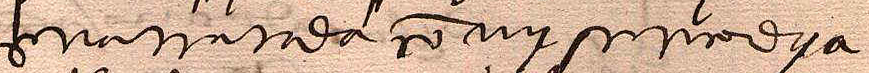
seria tratada c̄o mjsericordya
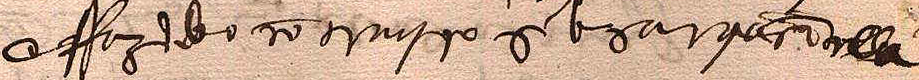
e ffazēdo o c̄otrayro se vzarya c̄o ella
